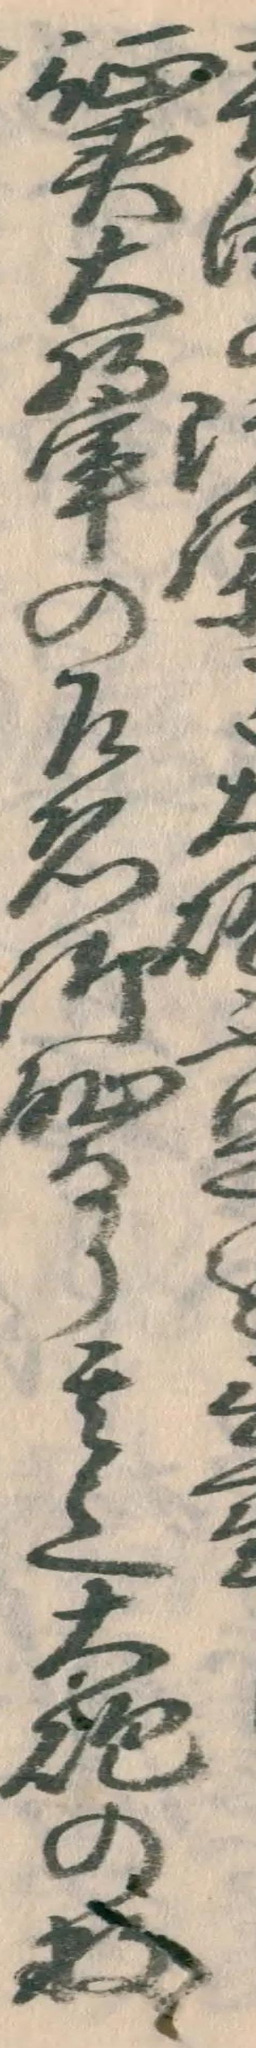征夷大将軍の乍恐御恥なり其上大砲の数
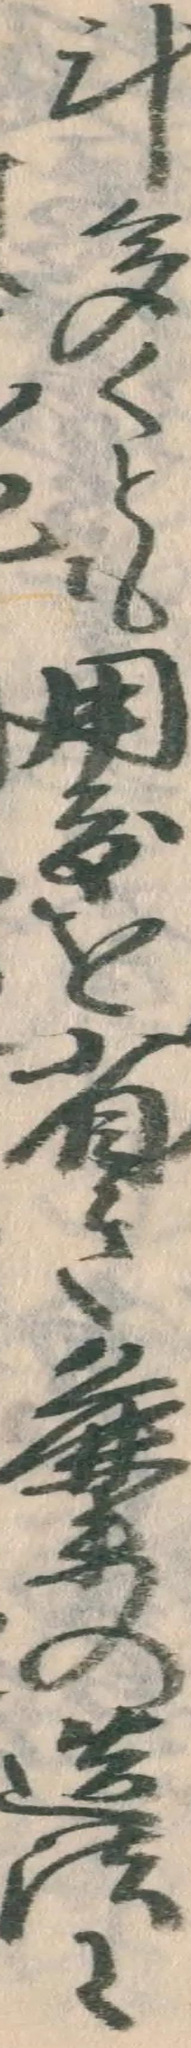斗多くとも用度を省き麁末の造法に
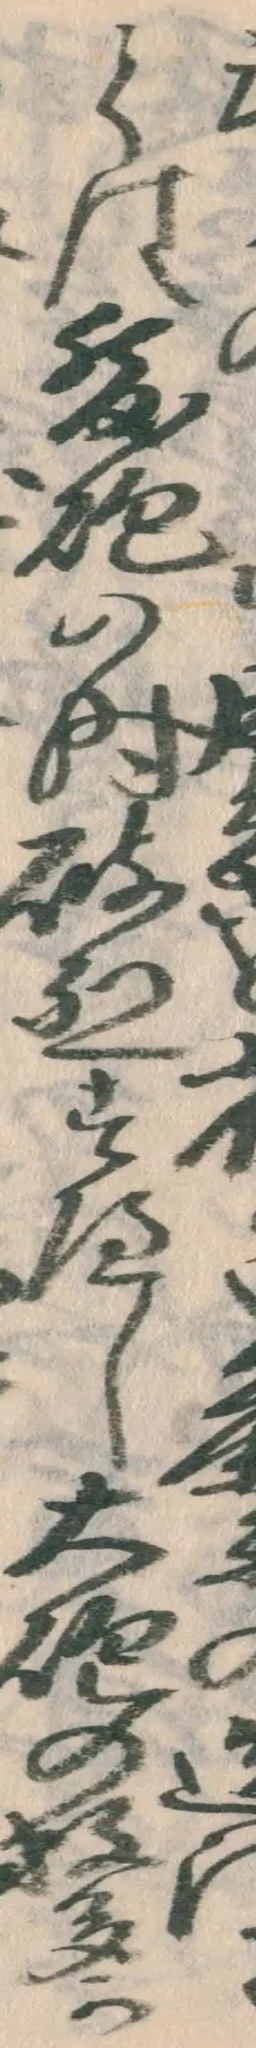ては発砲の時破烈すへし大砲の数多か
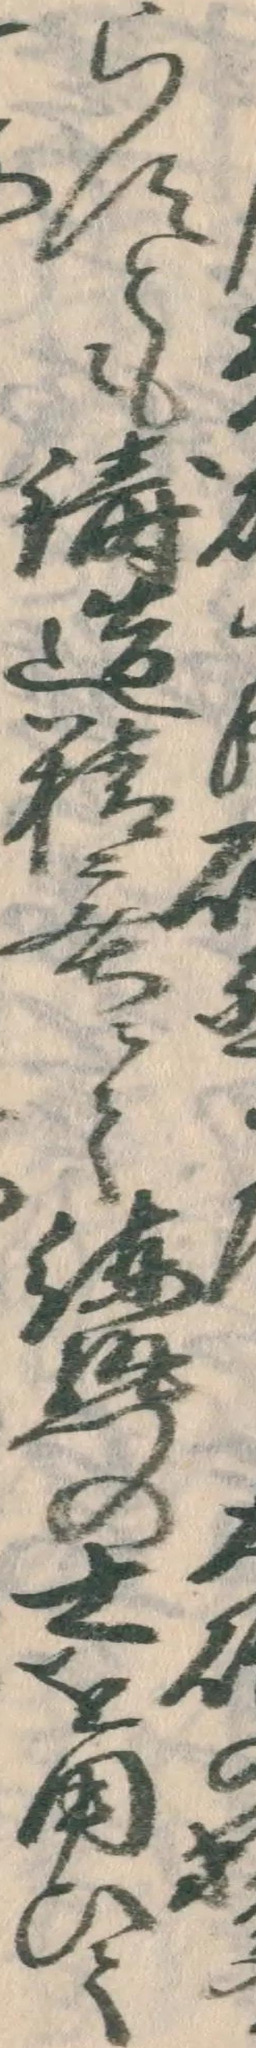らすとも鑄造精密ニて練熟の士を用ひて
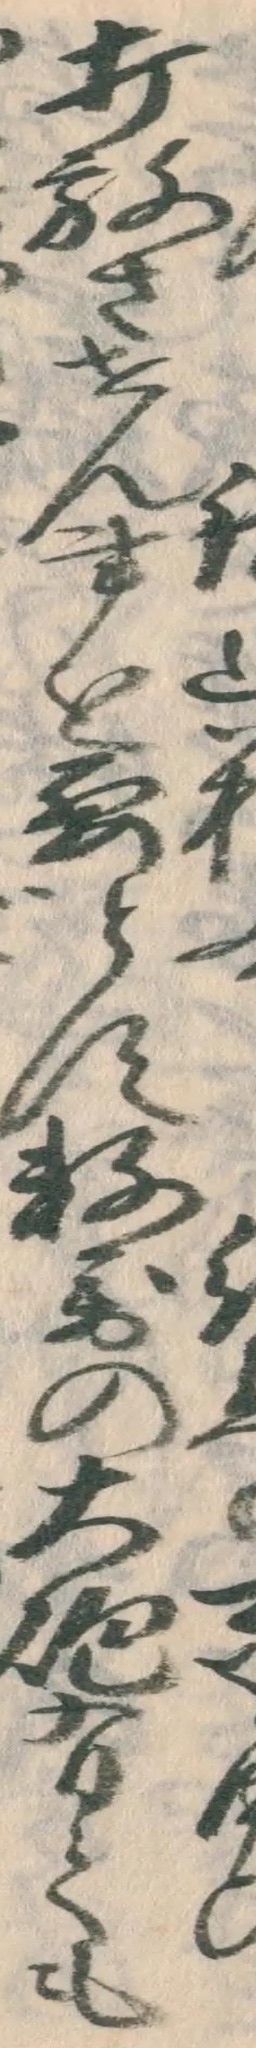打放させん事を要とす数萬の大砲有ても
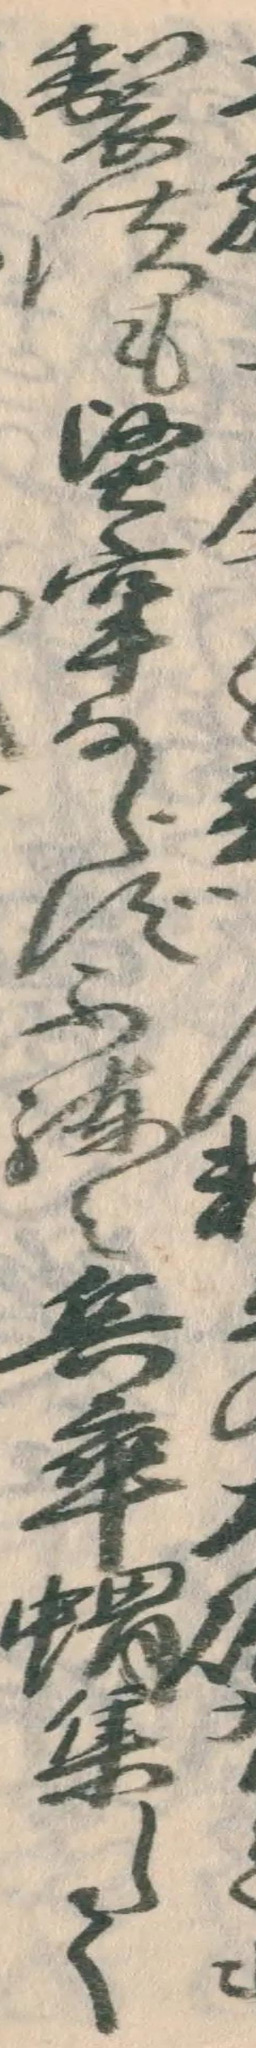製法も堅牢ならず不練之兵卒蝟集して
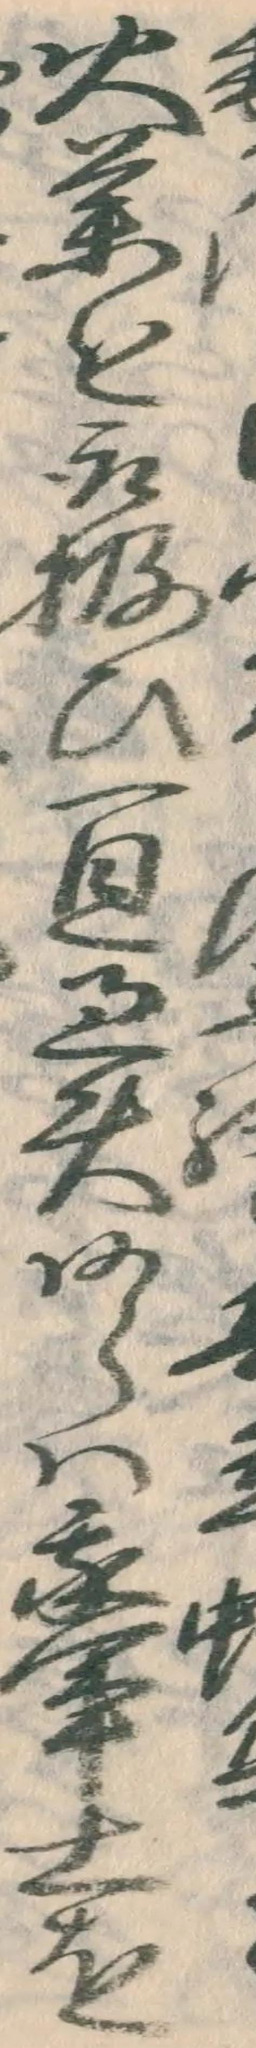火薬を取扱ひ一旦過失あらハ我軍士を
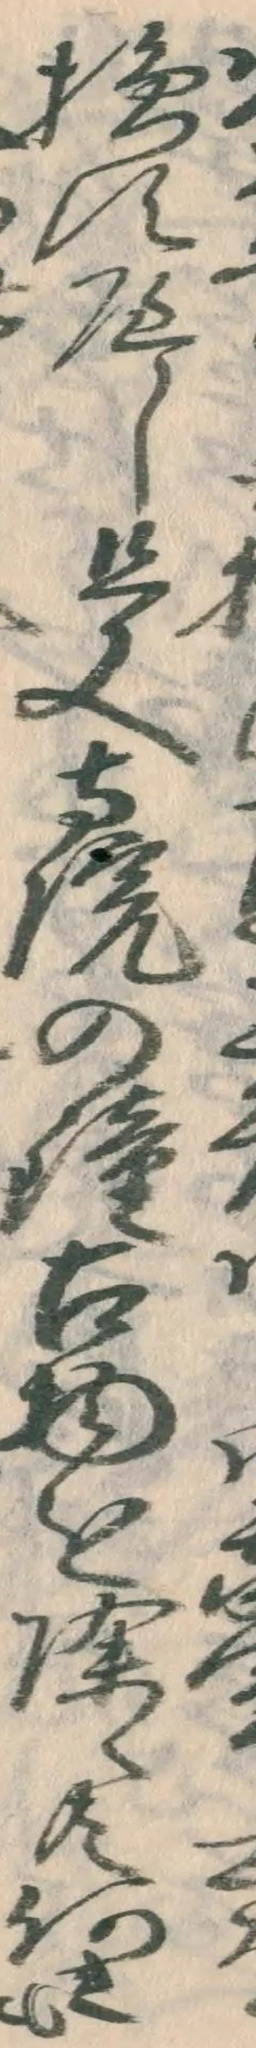損すへし且又寺院の鐘古物を除候共何れも
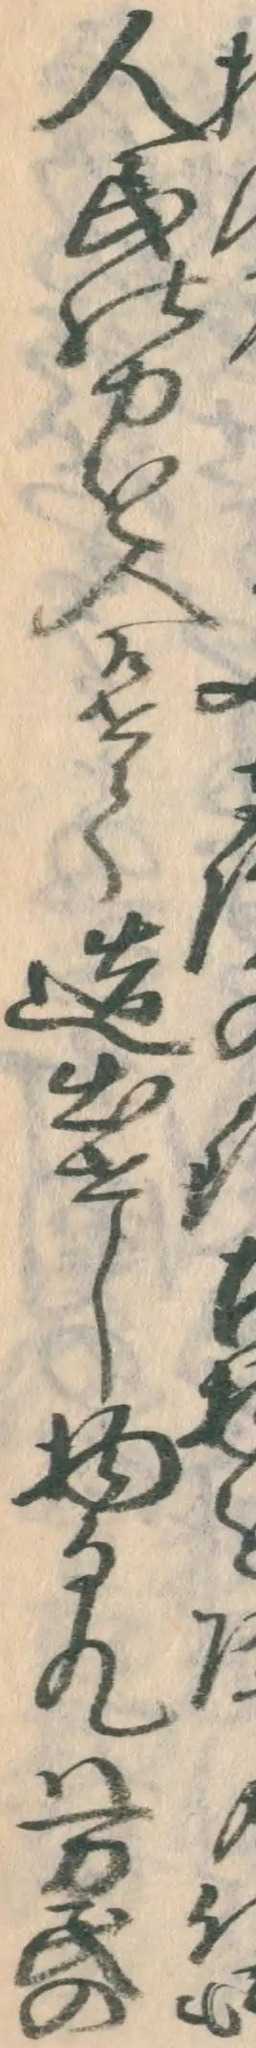人民の力を合せて造出せし物なれハ万民の

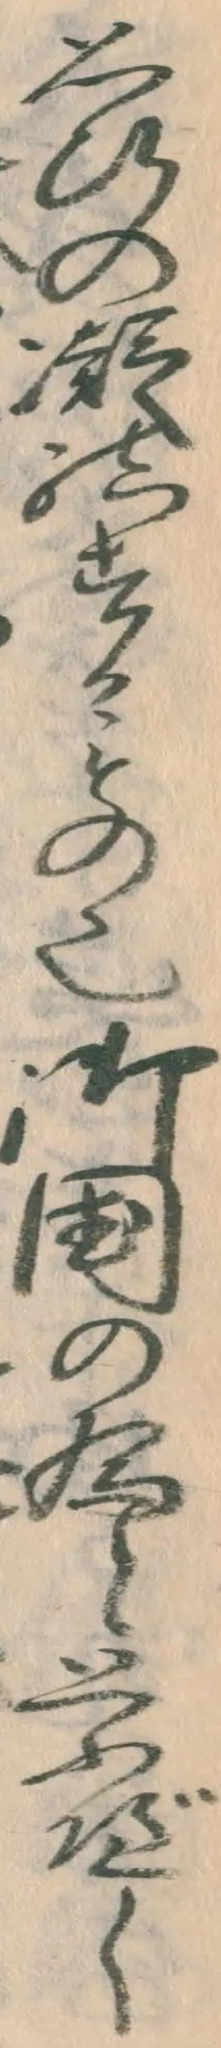思ひの凝結するもの也御国の為と思ふべし
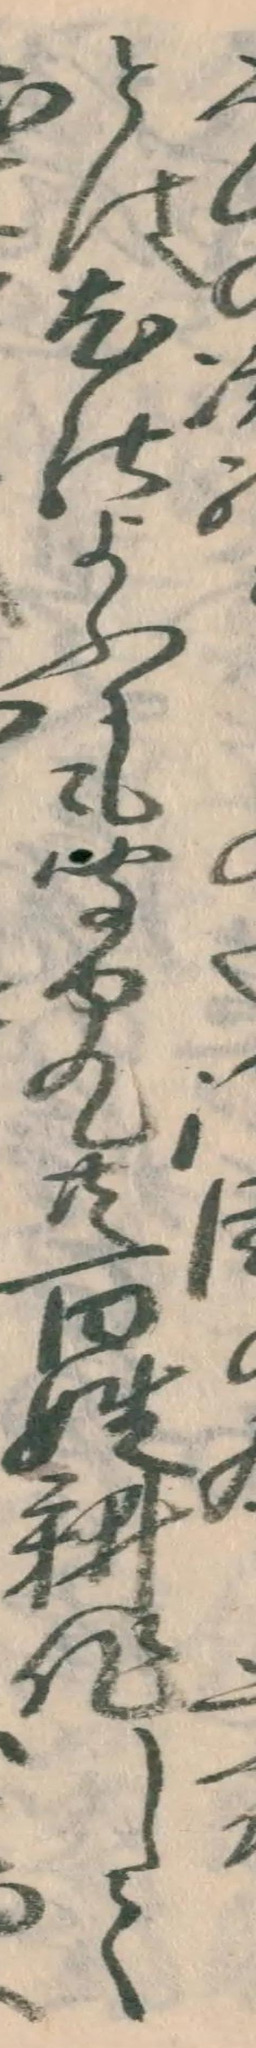とは尤のよふにも聞ゆれ共百姓耕作して
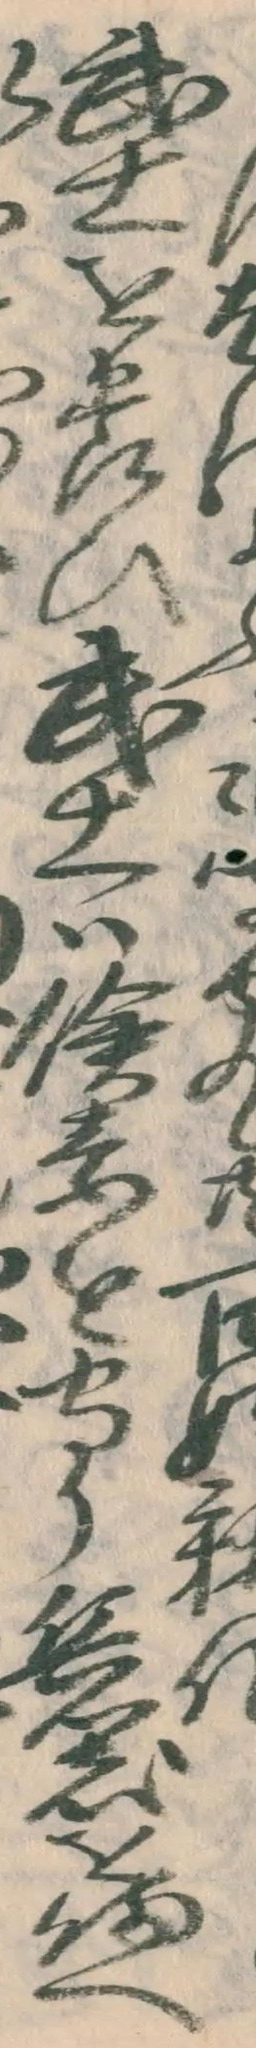武士を養ひ武士ハ倹素を守り兵器を備へ
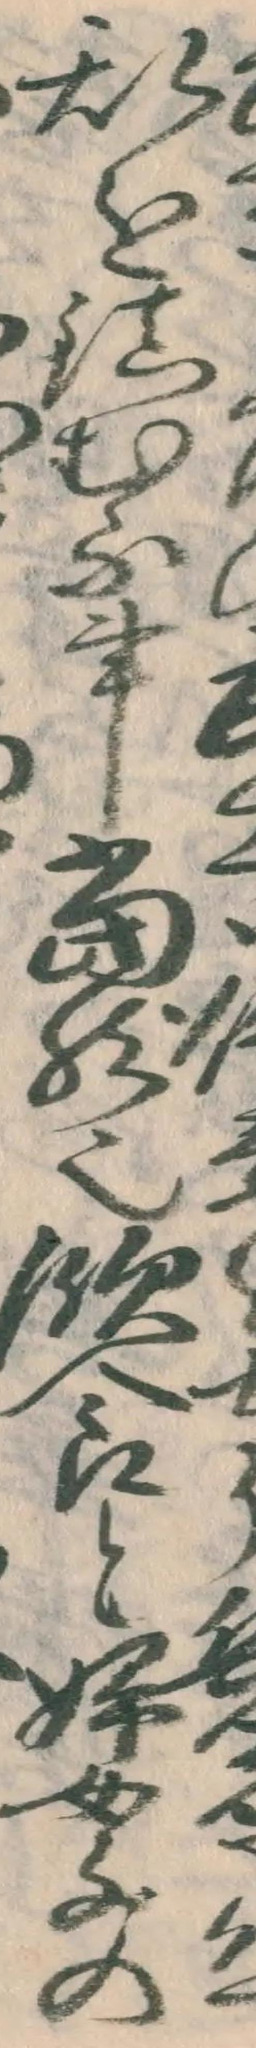乱を鎮むる事當然也飲食と婦女子の
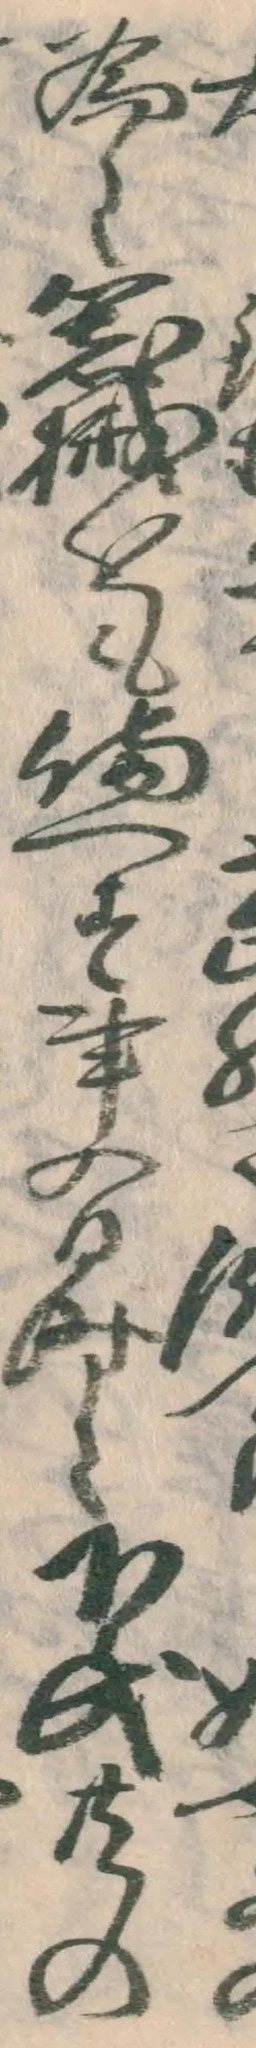為に器械をも備へす事有時に下民共の
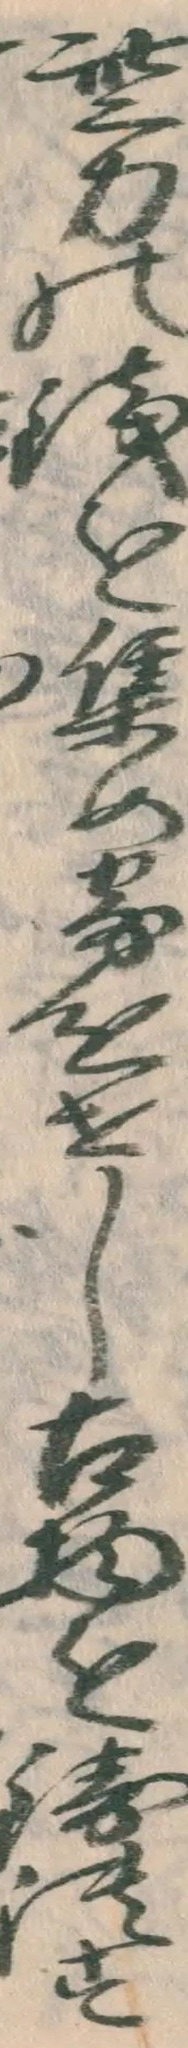些力の銭を集め寄進せし古物を鋳潰す
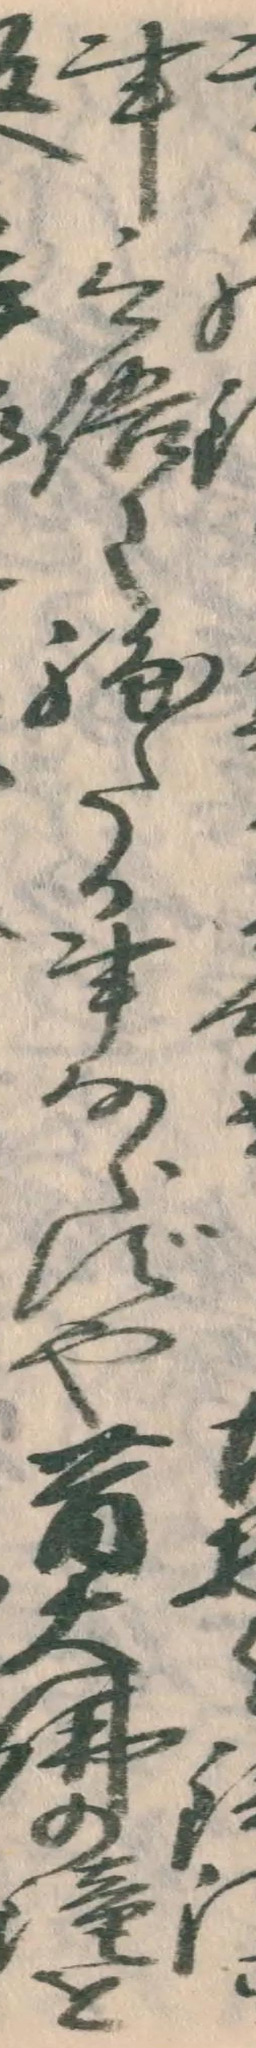事言語に絶たる事ならずや昔大佛の鐘を
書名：麗斎叢書. 20
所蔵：国立国会図書館 National Diet Library, JAPAN
